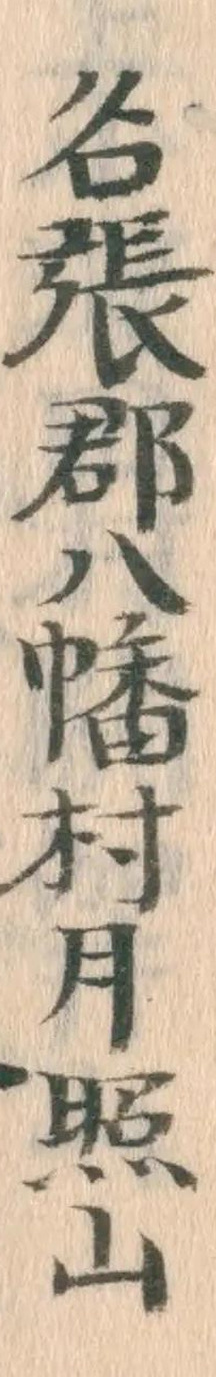名張郡八幡村月照山
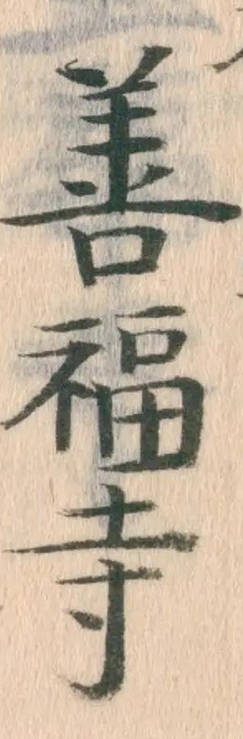善福寺
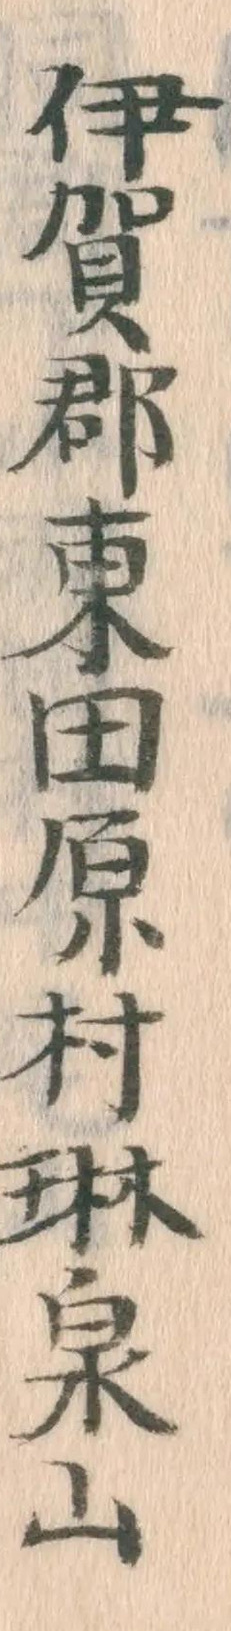伊賀郡東田原村琳泉山
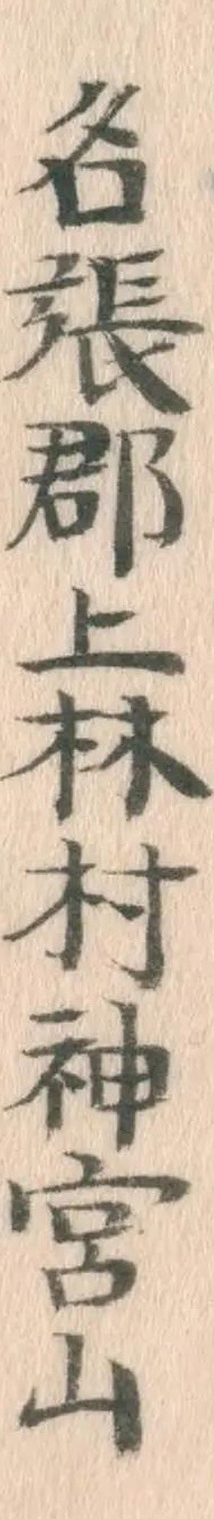名張郡上林村神宮山
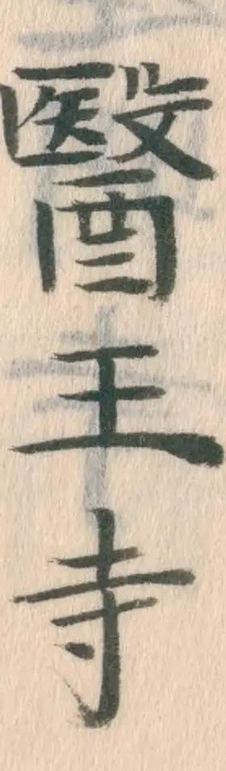医王寺
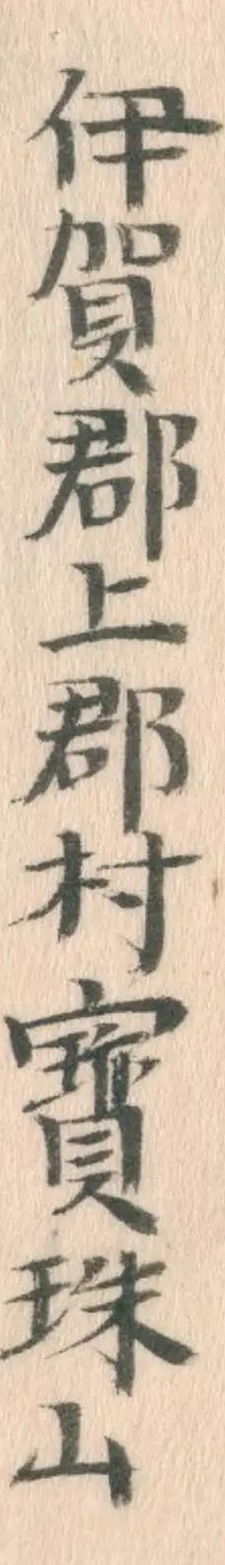伊賀郡上村宝珠山
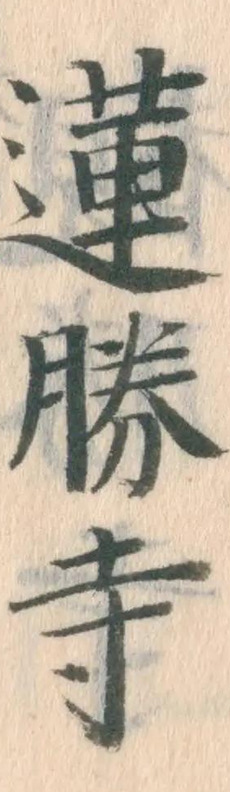蓮勝寺

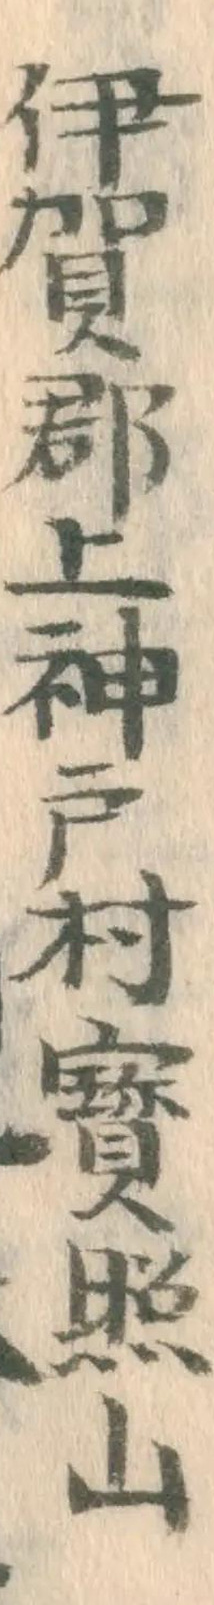伊賀郡上神戸村宝照山
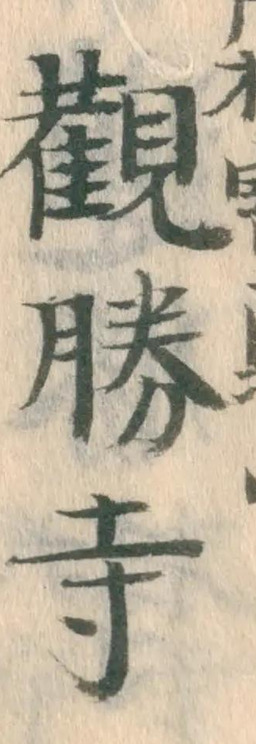観勝寺
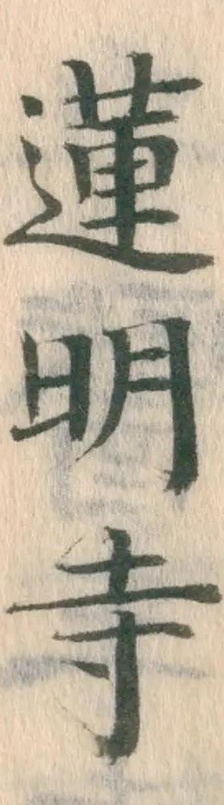蓮明寺
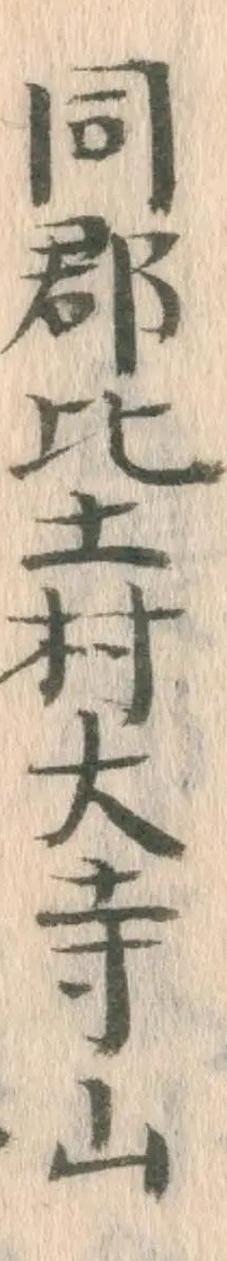同郡坒村大寺山
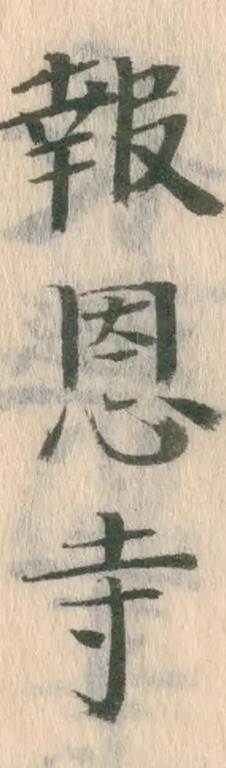報恩寺
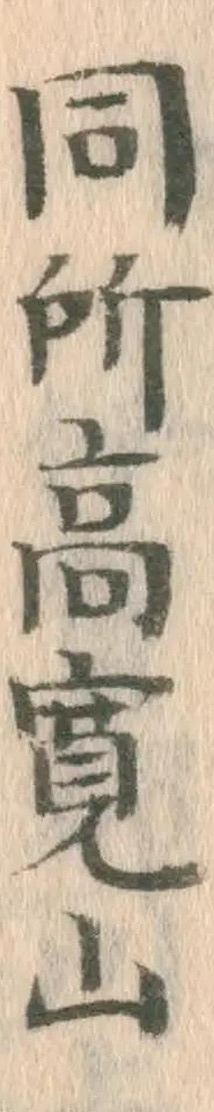同所高寛山
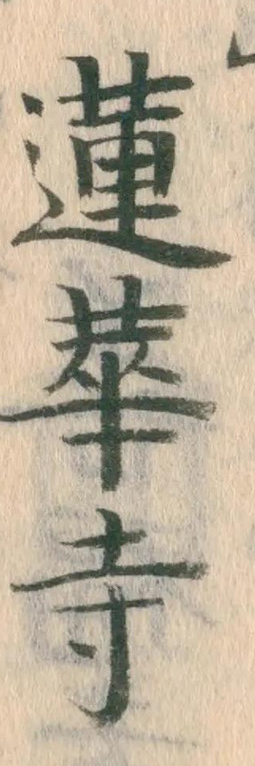蓮華寺
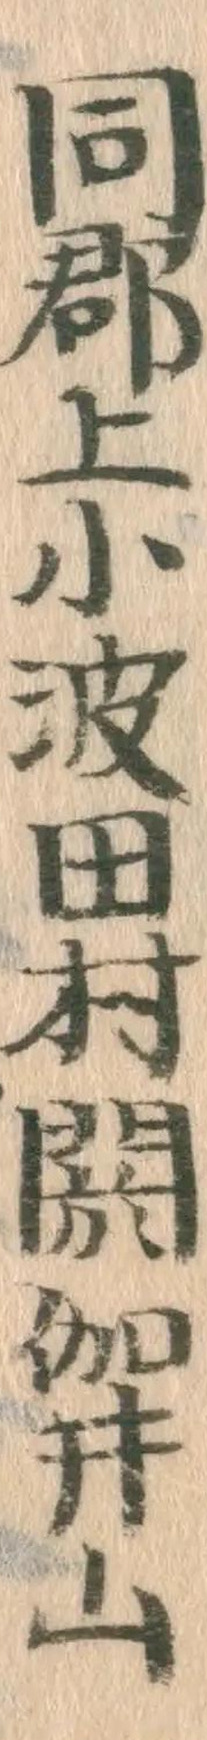同郡上小波田村関伽井山
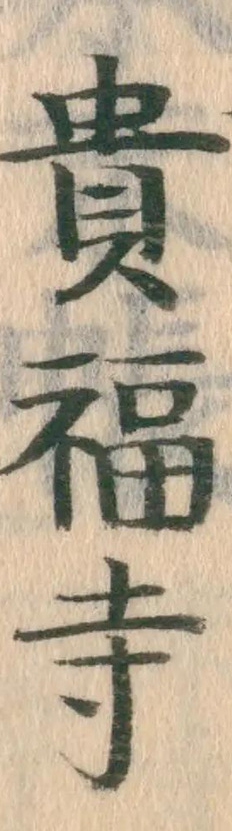貴福寺
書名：古義真言宗本末帳 21巻. [4] 第三 伊賀国、伊勢国、志摩国、尾張国、三河国、遠江国、駿河国、伊豆国、甲斐国
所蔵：国立国会図書館 National Diet Library, JAPAN
